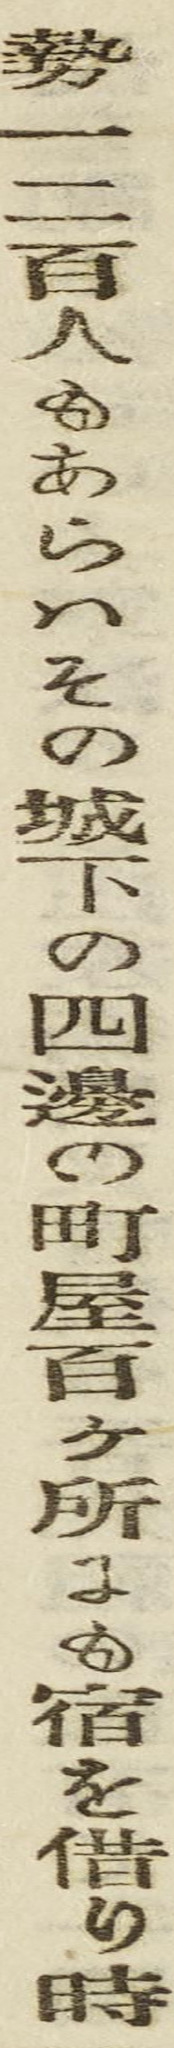勢一二百人もあらはその城下の四辺の町屋百ケ所にも宿を借り時
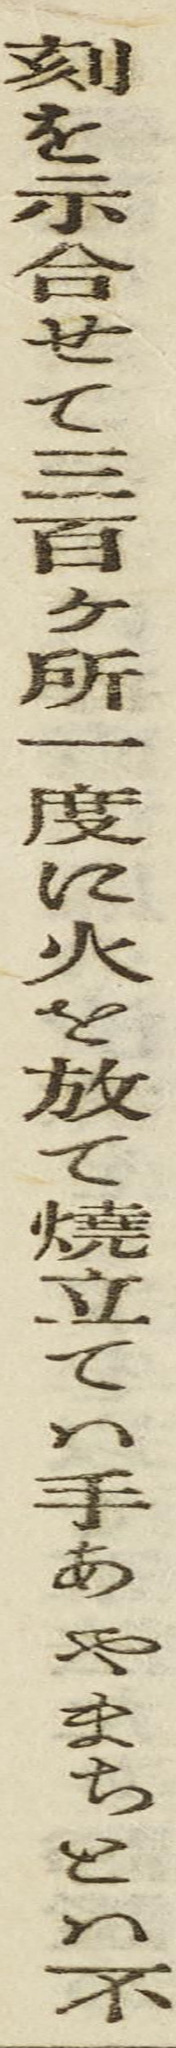刻を示合せて三百ケ所一度に火を放て焼立ては手あやまちとは不
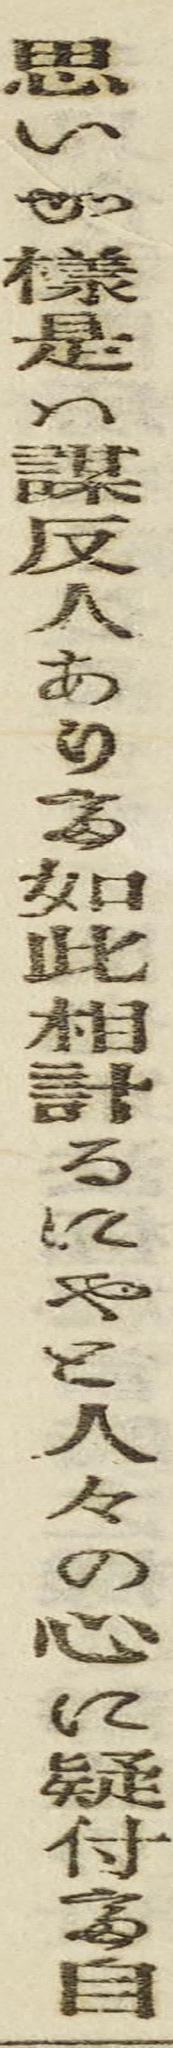思いか様是は謀反人ありる如此相計るにやと人々の心に疑付る自
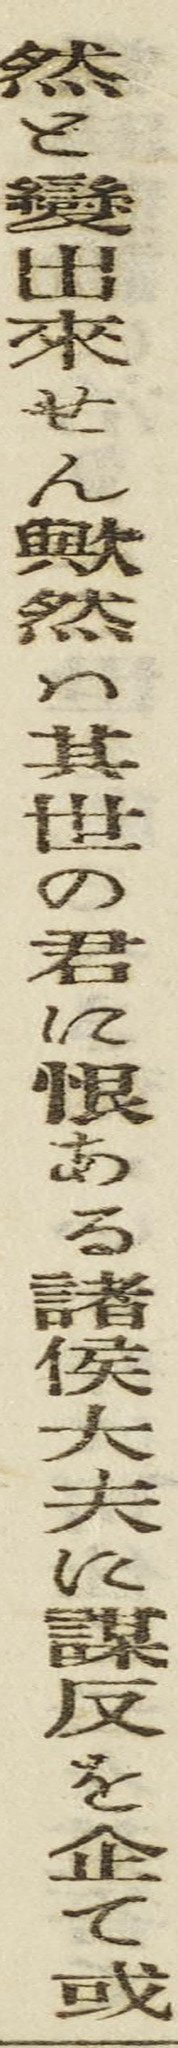然と変出来せん歟然は其世の君に恨ある諸侯大夫に謀反を企て或
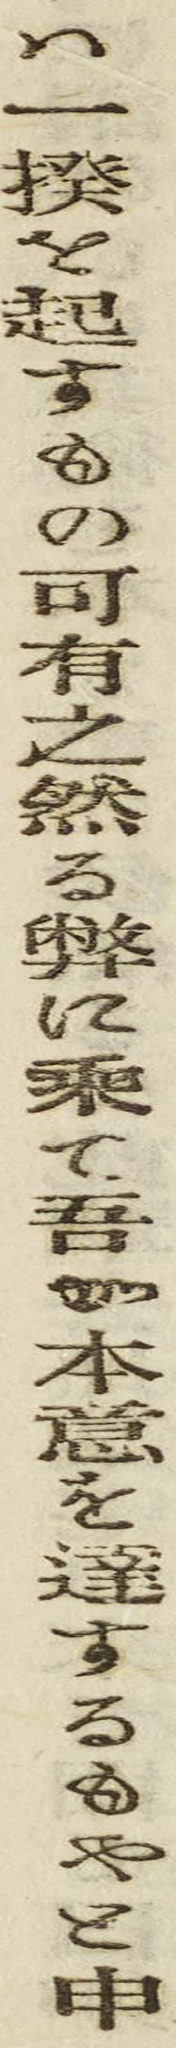は一揆を起すもの可有之然る弊に乗て吾が本意を達するもやと申
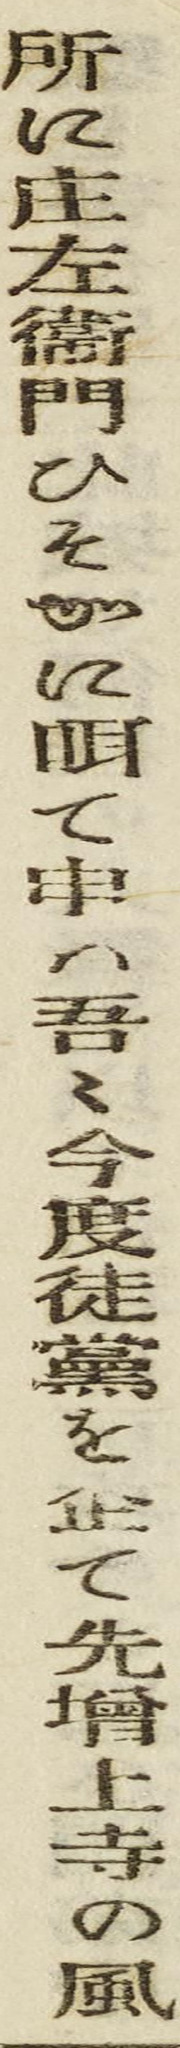所に庄左衞門ひそかに咡て申は吾々今度徒党を企て先増上寺の風
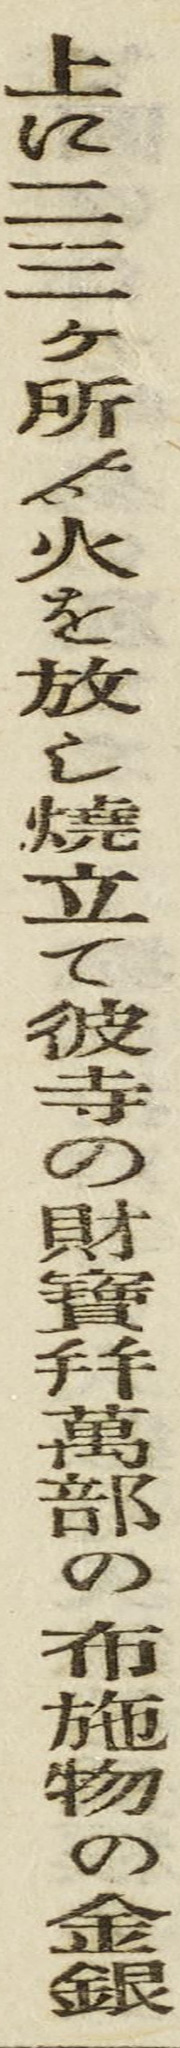上にニ三ケ所ゟ火を放し焼立て彼寺の財宝幷万部の布施物の金銀
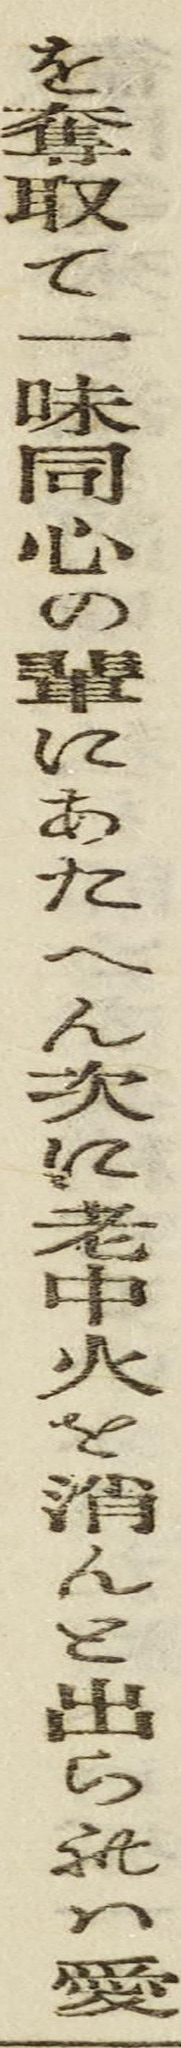を奪取て一味同心の輩にあたへん次に老中火を消んと出られは愛
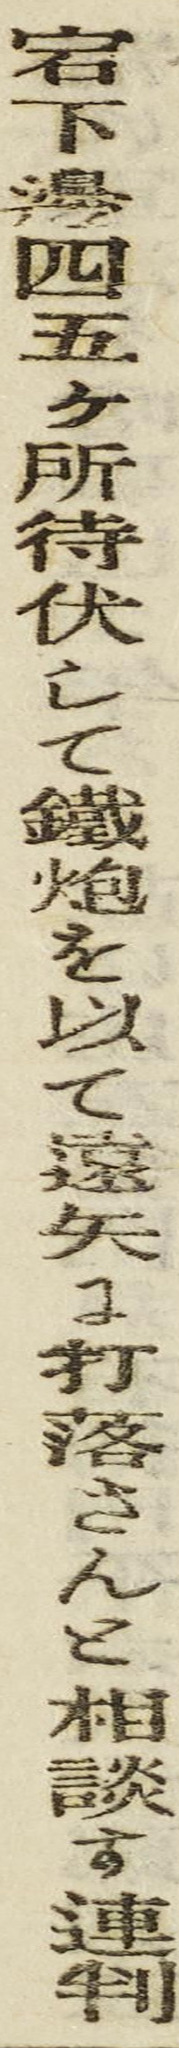宕下辺四五ケ所待伏して鉄炮を以て遠矢に打落さんと相談す連判
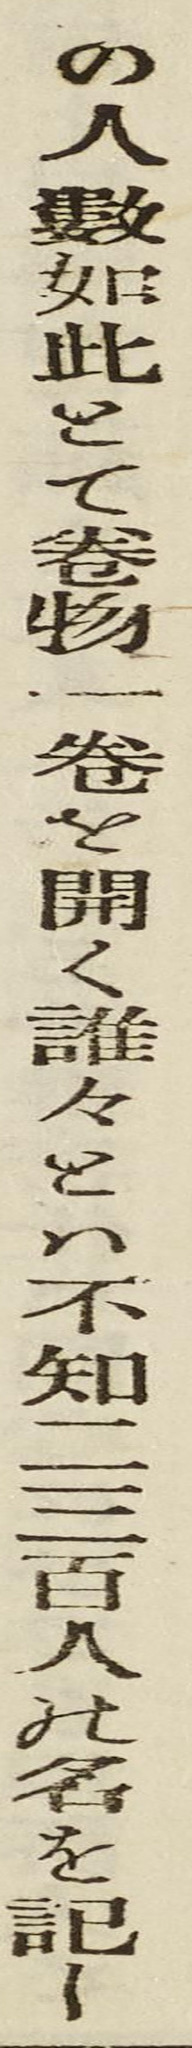の人数如此とて巻物一巻を開く誰々とは不知二三百人の名を記し
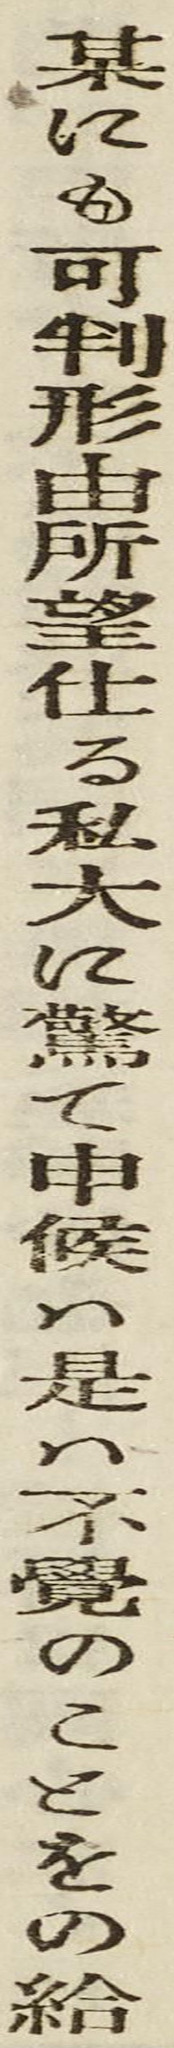某にも可判形由所望仕る私大に驚て申候は是は不覚のことをの給
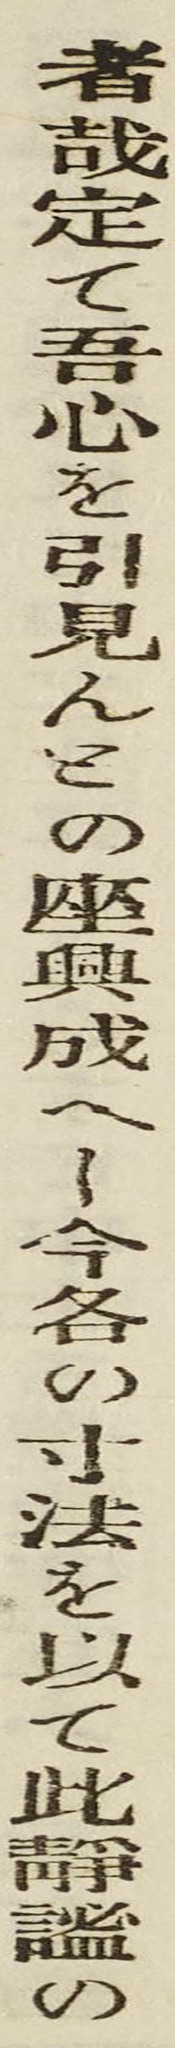者哉定て吾心を引見んとの座興成へし今各の寸法を以て此静謐の
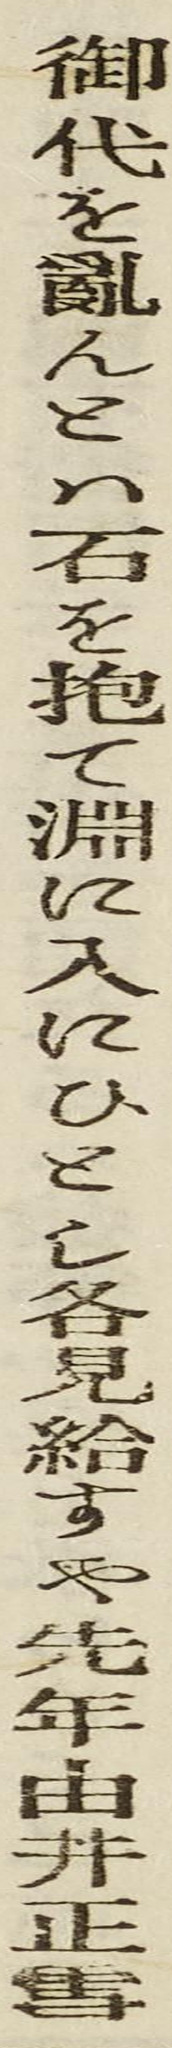御代を乱んとは石を抱て淵に入にひとし各見給すや先年由井正雪
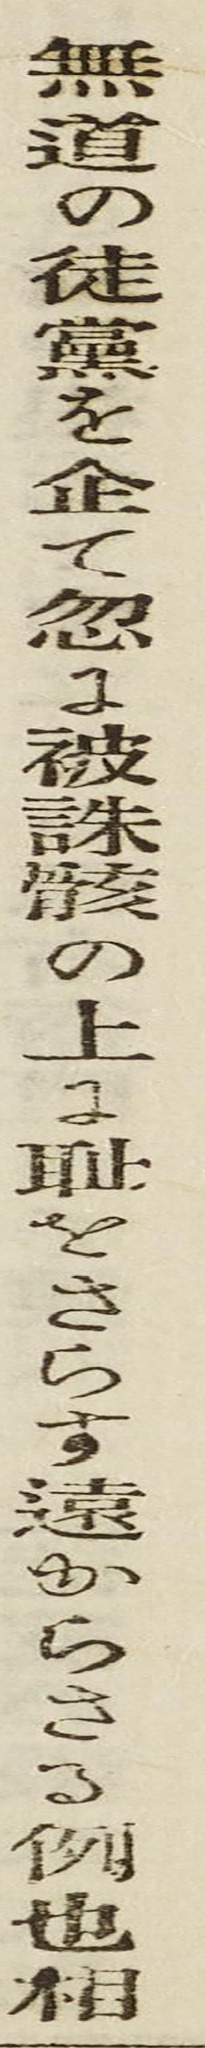無道の徒党を企て忽に被誅骸の上に恥をさらす遠からさる例也相
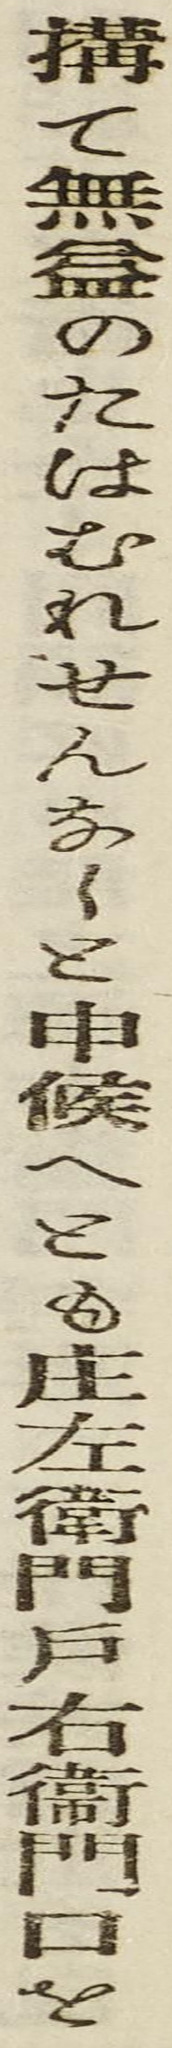搆て無益のたはむれせんなしと申候へとも庄左衛門戸右衞門口を
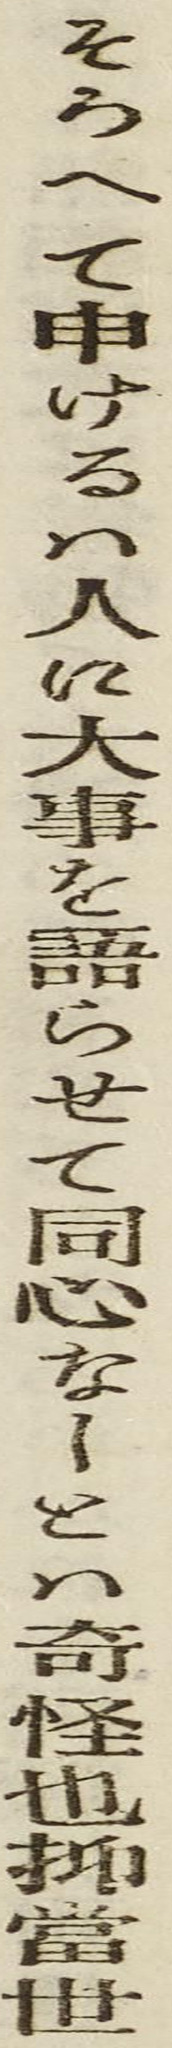そろへて申けるは人に大事を語らせて同心なしとは奇怪也抑当世
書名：史籍集覽　朝鮮陣古文・細井廣澤記・颶風紀事・天明七年將軍宣下次第書　全
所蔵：東京大学地震研究所図書室 Earthquake Research Institute Library, The University of Tokyo, JAPAN
